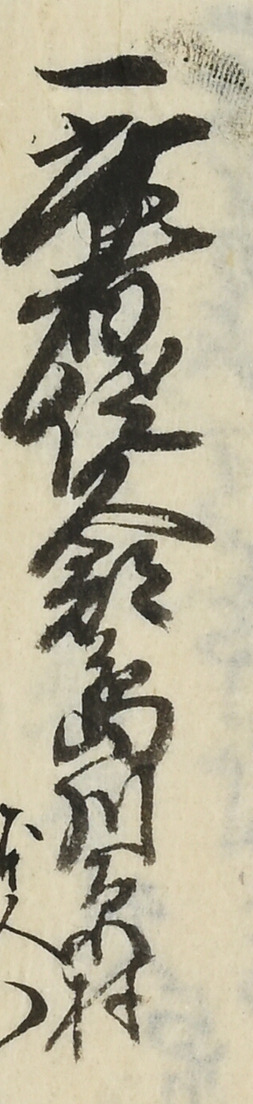一此者佐久郡島川原村
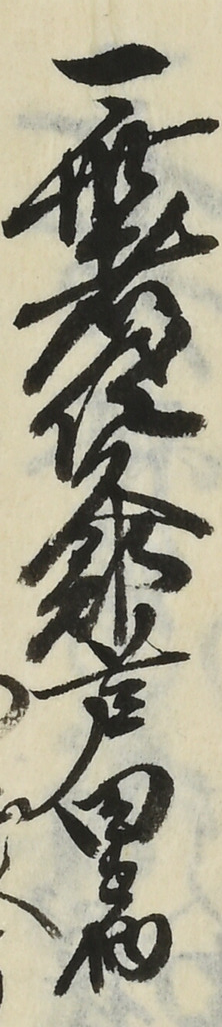一此者佐久郡芦田宿

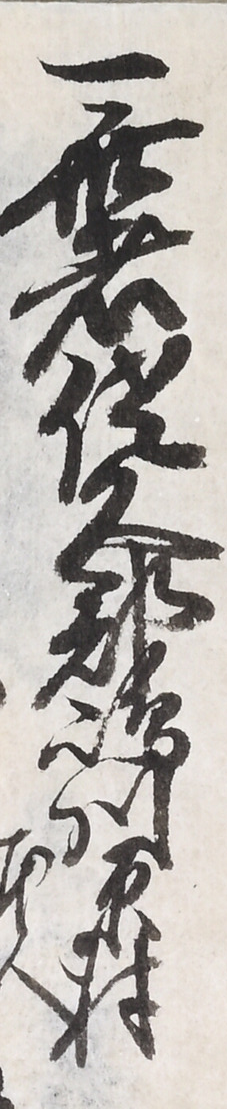一此者佐久郡島川原村
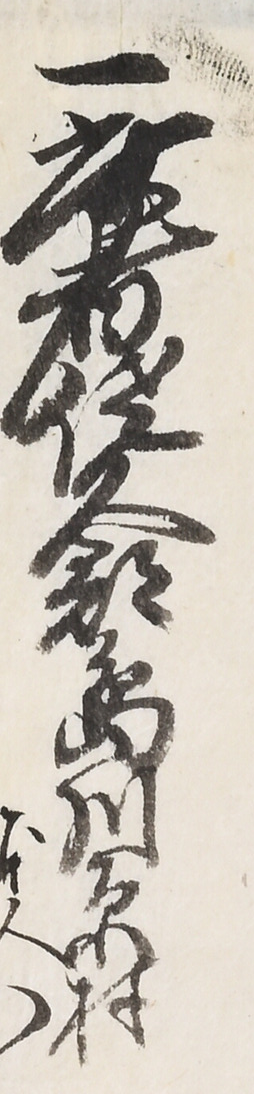一此者佐久郡島川原村
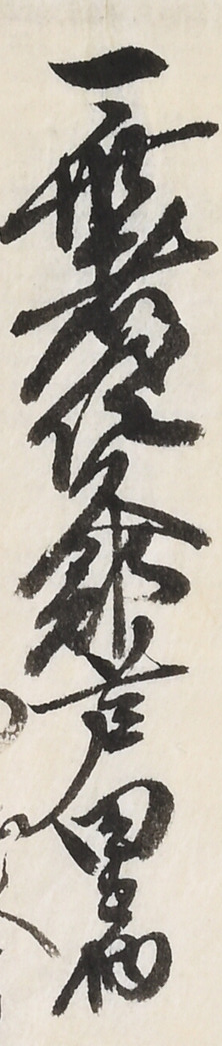一此者佐久郡芦田宿
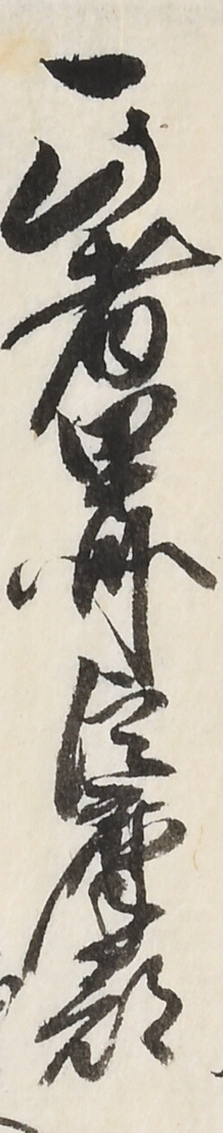一此者甲州巨摩郡
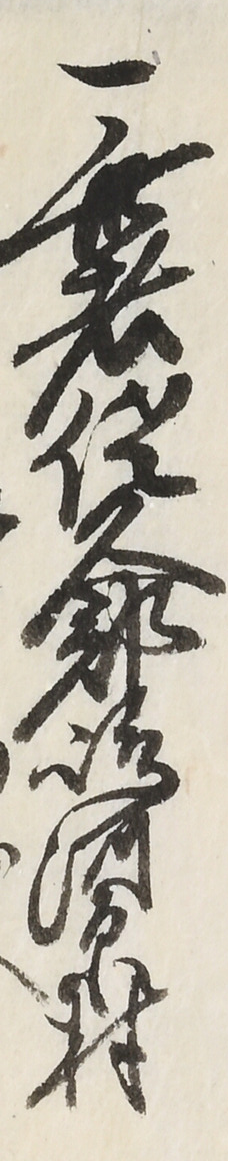一此者佐久郡島河原村
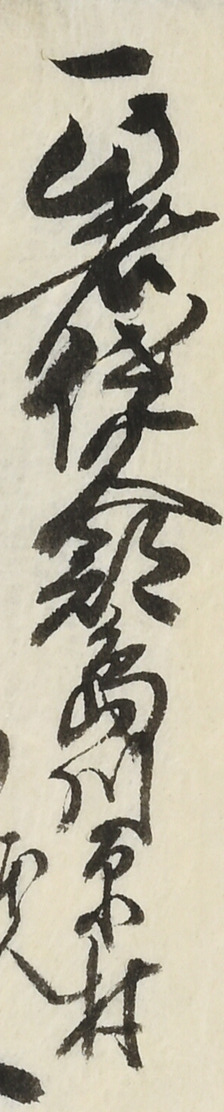一此者佐久郡島川原村
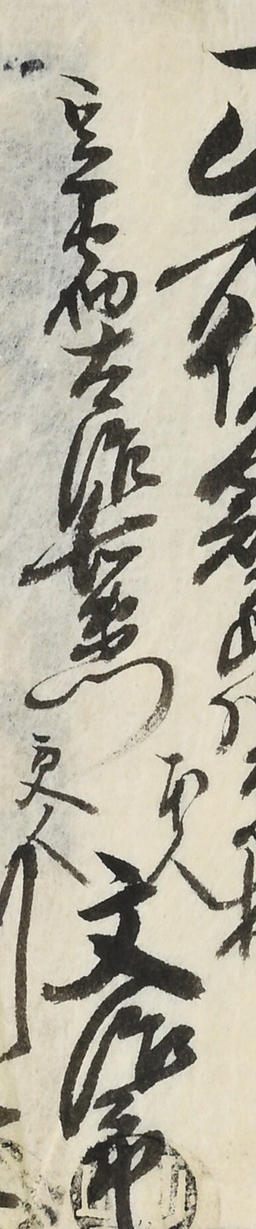定宿太治右衛門本人文治郎㊞

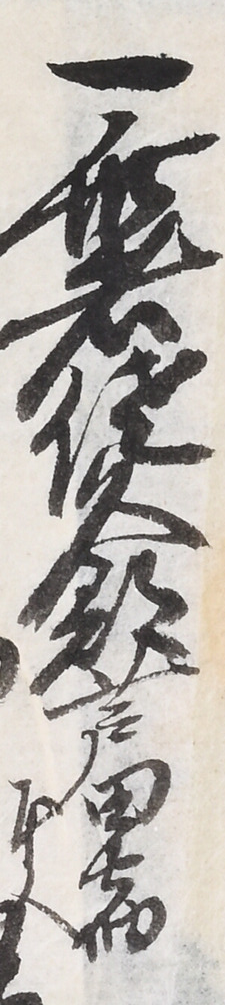一此者佐久郡芦田宿
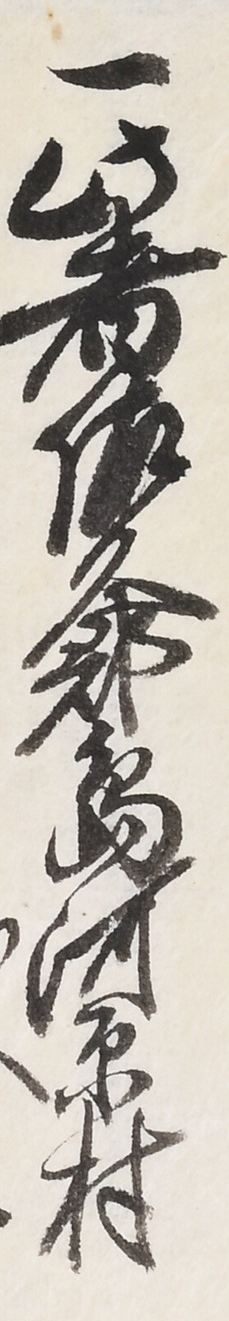一此者佐久郡島河原村
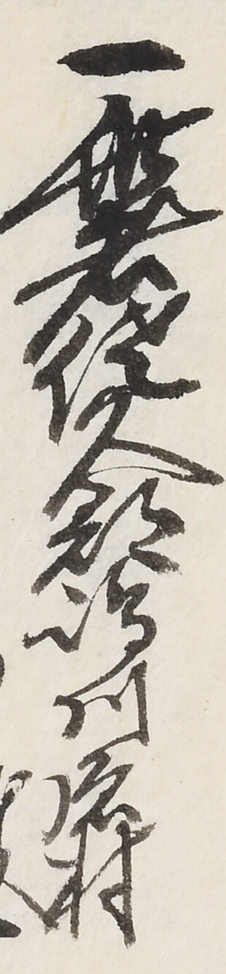一此者佐久郡島川原村
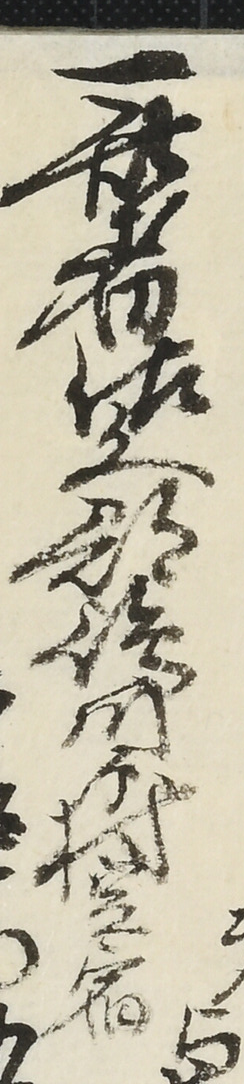一此者佐久郡島川原村定宿

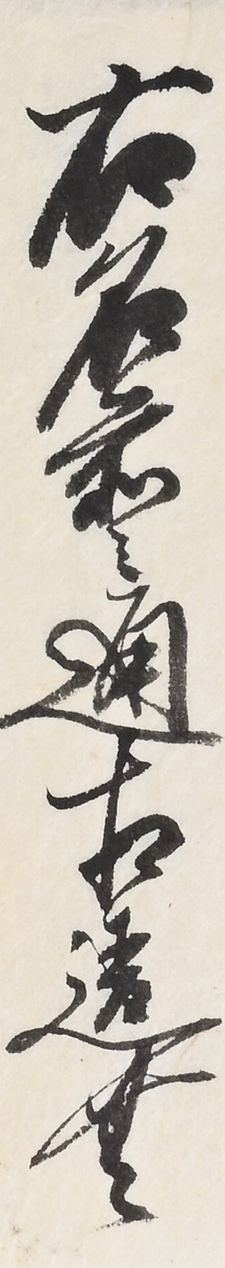右名前之通相違無
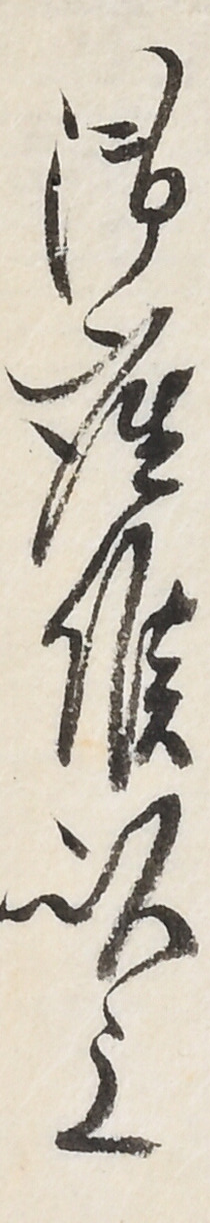御座候以上
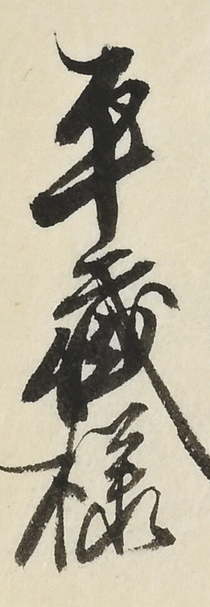平蔵様
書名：安政六己未年正月他国石切名前書上帳
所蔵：伊那市立高遠町図書館・合同会社AMANE
